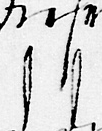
1.)
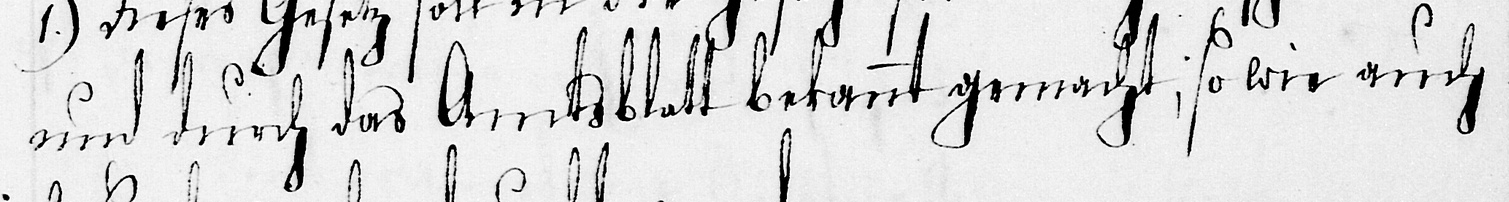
und durch das Amtsblatt bekannt gemacht; so wie auch
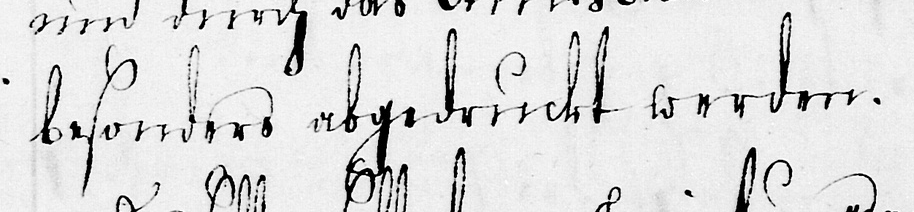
besonders abgedruckt werden.
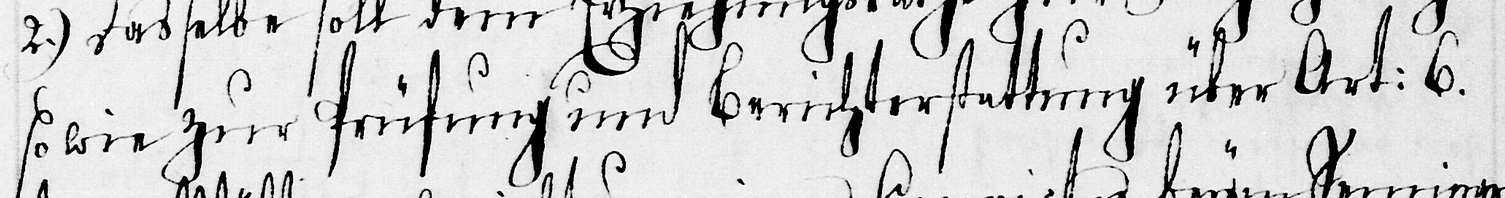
sowie zur Prüfung und Berichterstattung über Art: 6.
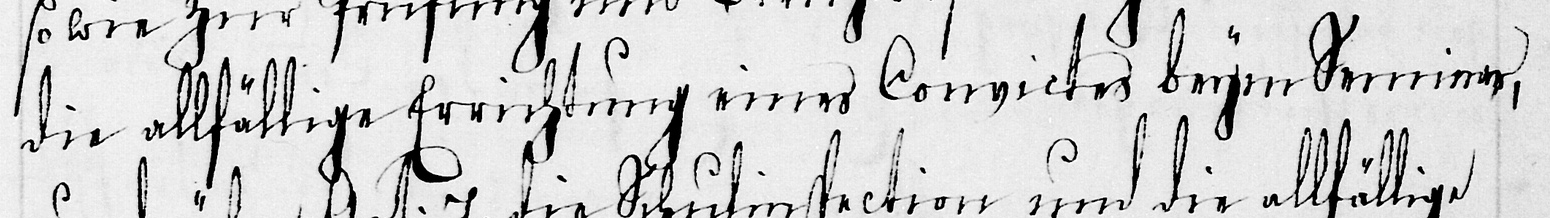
die allfällige Errichtung eines Convictes beym Seminar,
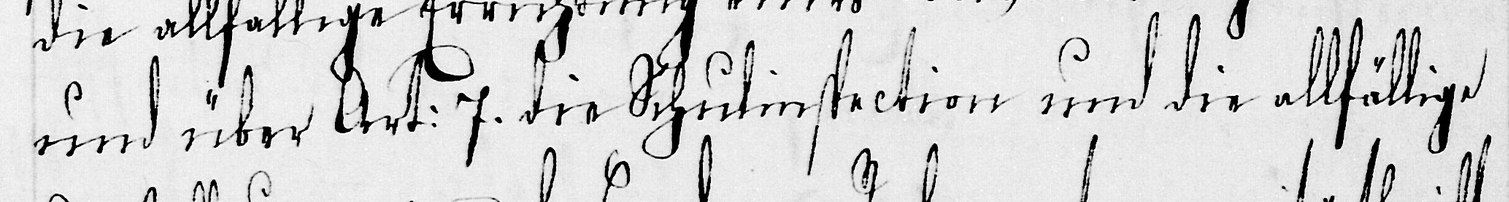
und über Art: 7. die Schulinspection und die allfällige
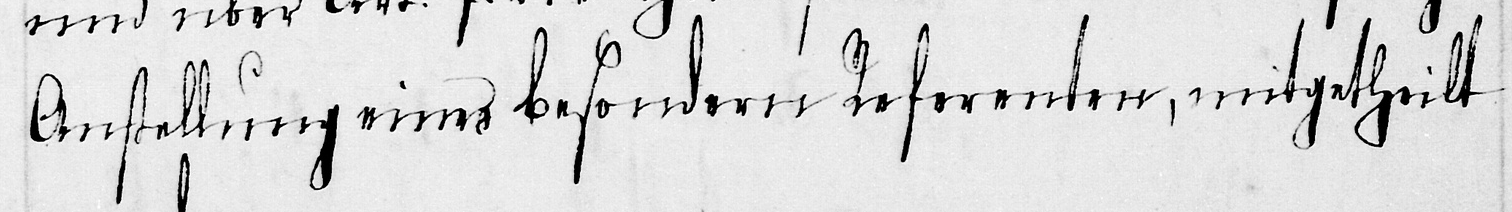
Anstellung eines besondern Referenten, mitgetheilt
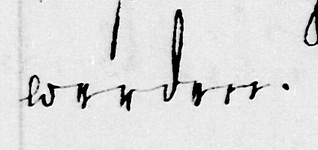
werden.
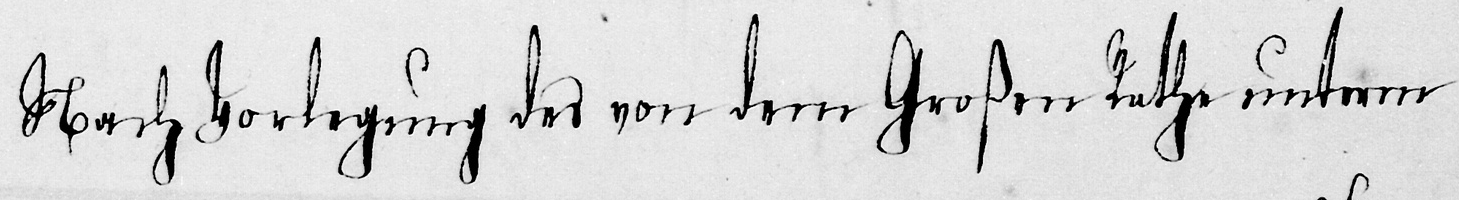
Nach Vorlegung des von dem Großen Rathe unterm
